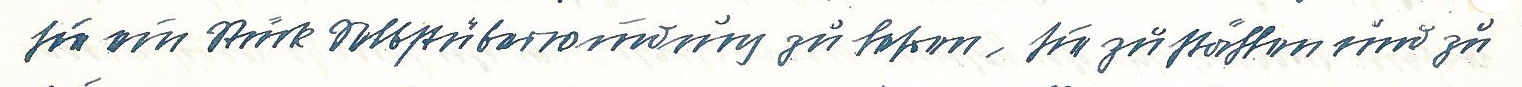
sie ein Stück Selbstüberwindung zu lehren, sie zu stählen und zu
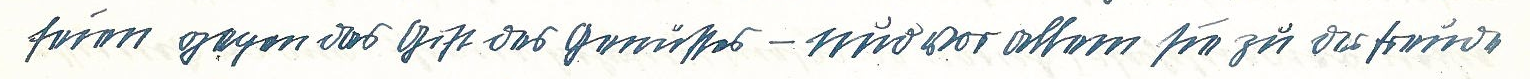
feien gegen das Gift des Genusses – und vor allem sie zu der Freude
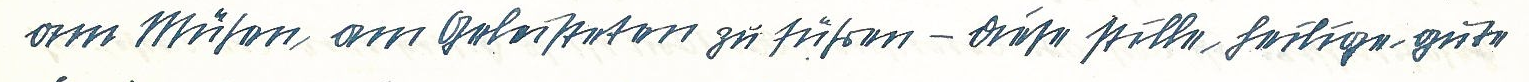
am Mühen, am Geleisteten zu führen – diese stille, heilige, gute
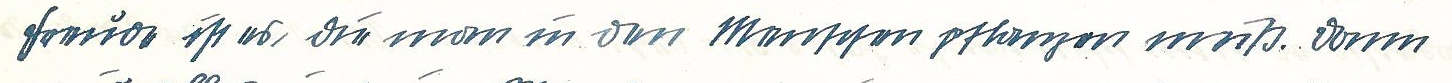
Freude ist es, die man in den Menschen pflanzen muß. Dann
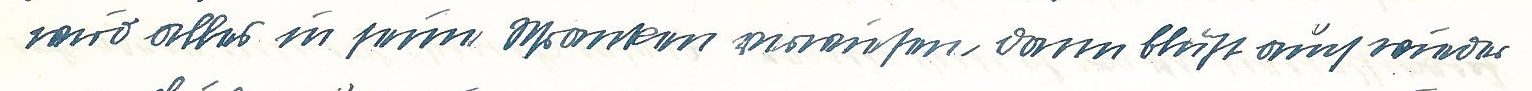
wird alles in seine Schranken verwiesen, dann blüht auch wieder
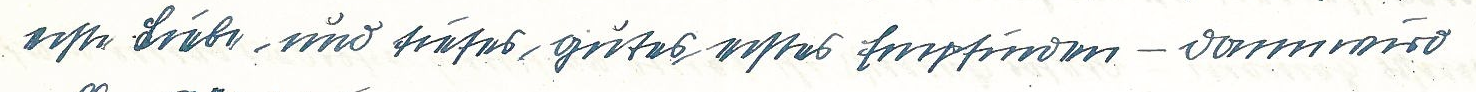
die Liebe, und tiefes, gutes, echtes Empfinden – dann wird
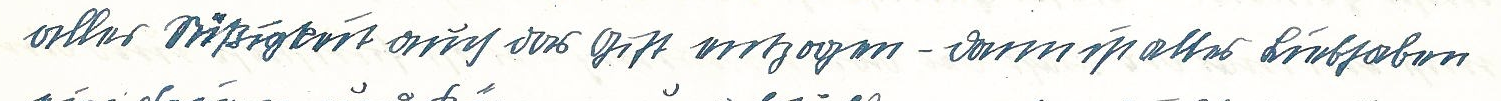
aller Süßigkeit auch das Gift entzogen – dann ist alles Liebhaben
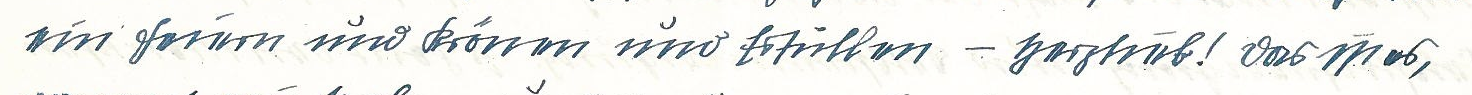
ein Feiern und Krönen und Erfüllen – Herzlieb! Das ist es,
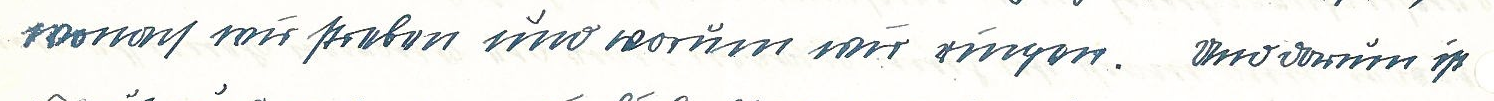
wonach wir streben und worum wir ringen. Und darum ist
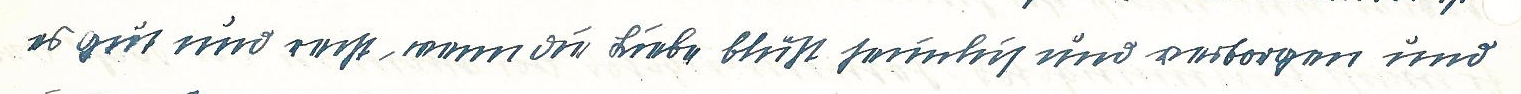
es gut und recht, wenn die Liebe blüht heimlich und verborgen und
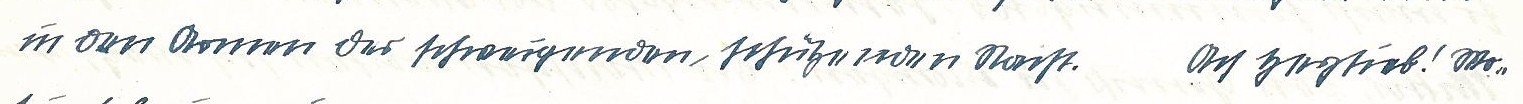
in den Armen der schweigenden, schützenden Nacht. Ach Herzlieb! Wo¬
